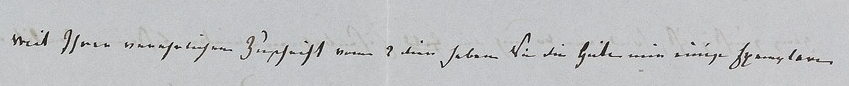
Mit Ihrer verehrlichen Zuschrift vom 2 dies haben Sie die Güte mir einige Exemplare
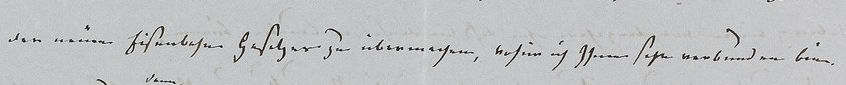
des neuen Eisenbahn Gesetzes zu übermachen, wofür ich Ihnen sehr verbunden bin.
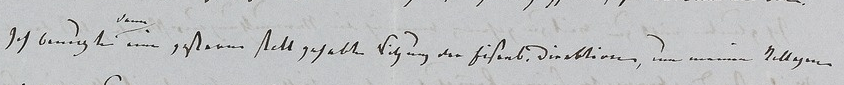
Ich benuzte dann eine gestern statt gehabte Sitzung der Eisenb. Direktion, um meinen Kollegen
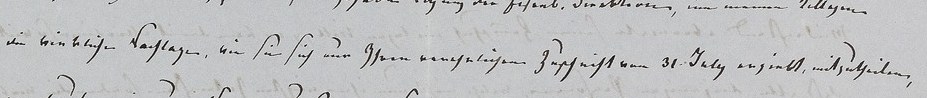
die wirkliche Sachlage, wie sie sich aus Ihrer verehrlichen Zuschrift vom 31. July ergiebt, mitzutheilen,
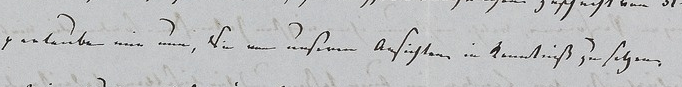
& erlaube mir nun, Sie von unseren Ansichten in Kenntniß zu setzen.
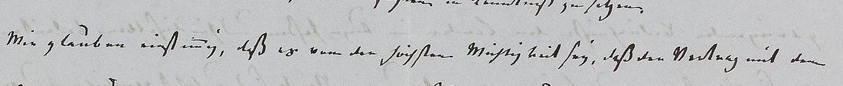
Wir glauben einstimmig, daß es von der höchsten Wichtigkeit sey, daß der Vertrag mit dem
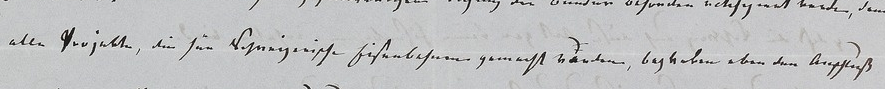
alle Projekte, die für Schweizerische Eisenbahnen gemacht werden, bezweken eben den Anschluß
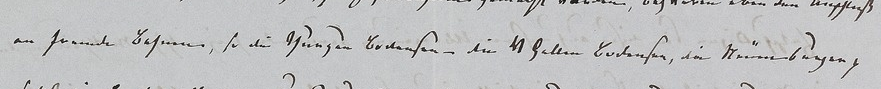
an fremde Bahnen, so die ThurgauBodensee – die St GallenBodensee, die Neuenburger &
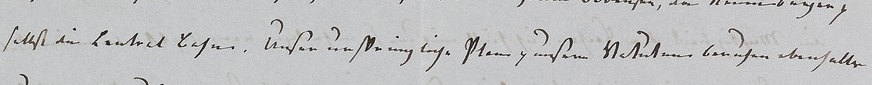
selbst die Central Bahn. Unser ursprüngliche Plan & unsere Statuten beruhen ebenfalls
